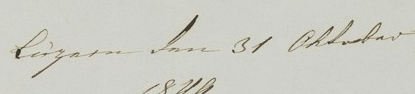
Luzern den 31 Oktober
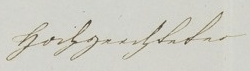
Hochgeachteter
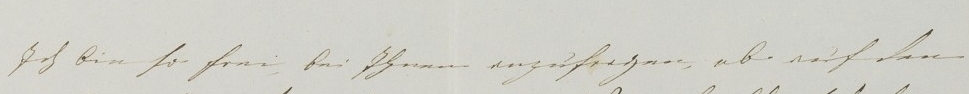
Ich bin so frei, bei Ihnen anzufragen, ob auf den
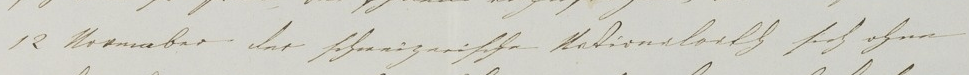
12 November der schweizerische Nationalrath sich ohne
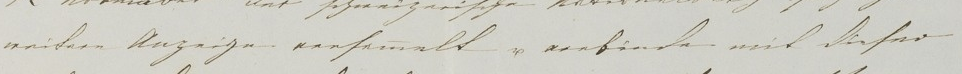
weitere Anzeige versammelt & verbinde mit dieser
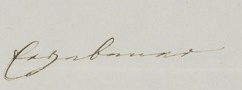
Ergebener
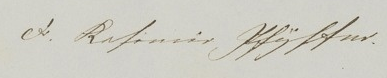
Dr. Kasimir Pfyffer.
